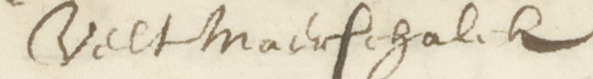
VeltMaerschalck
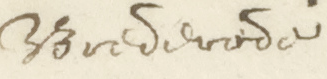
Brederode
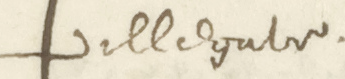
Pillegave.
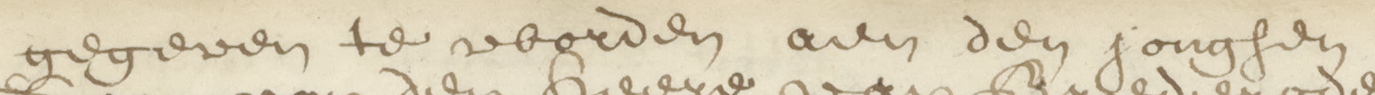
gegeven te worden aen den jonghen
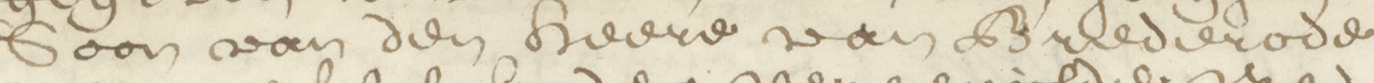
Soon van den heere van Brederode
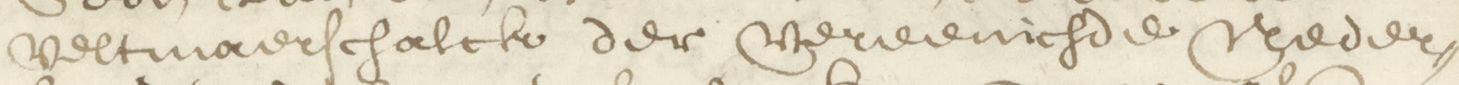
Veltmaerschalck der Vereenichde Neder„
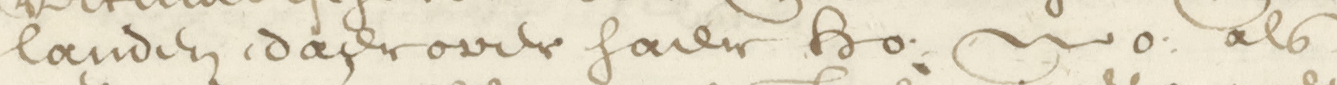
landen, daer over haer Ho:Mo: als
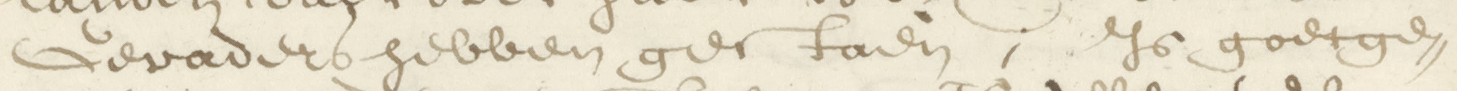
Gevaders hebben gestaen, Is goetge„
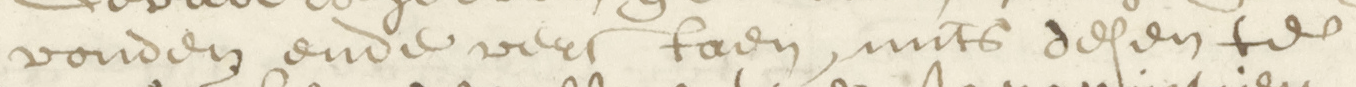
vonden ende verstaen, mits desen te
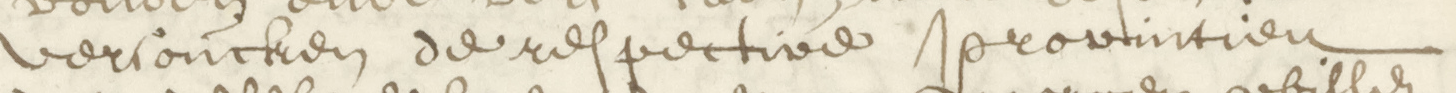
versoucken de respective Provintien
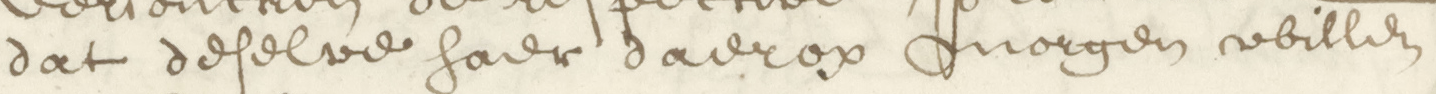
dat deselve haer daerop morgen willen
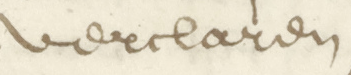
verclaren.
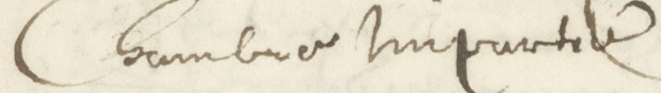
Chambre mipartie
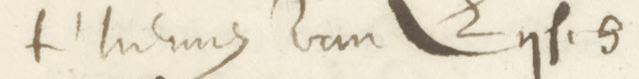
t' nemen van Eysch
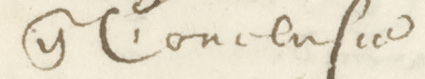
& Conclusie
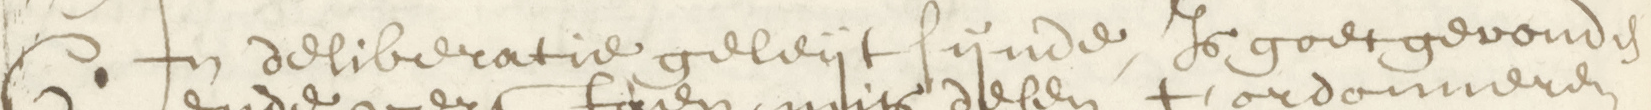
In deliberatie geleijt sijnde, Is goetgevonden
